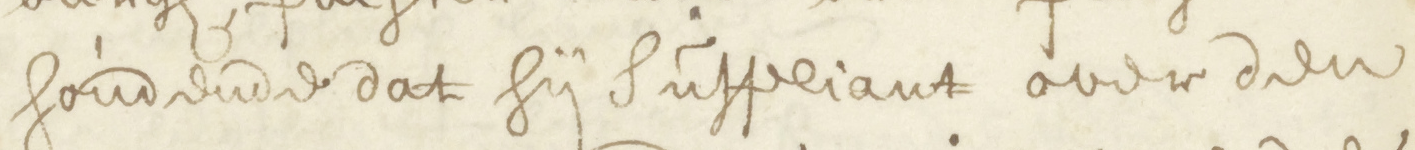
houdende dat hij Suppliant over den
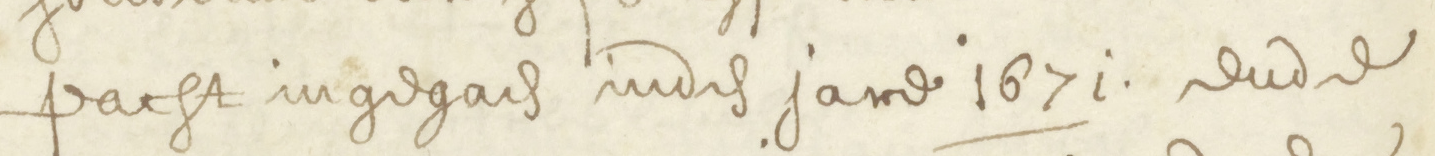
pacht ingegaen inden jare 1671. ende
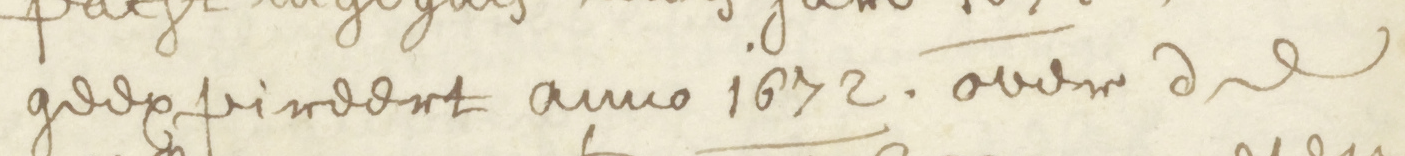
geexpireert anno 1672. over de
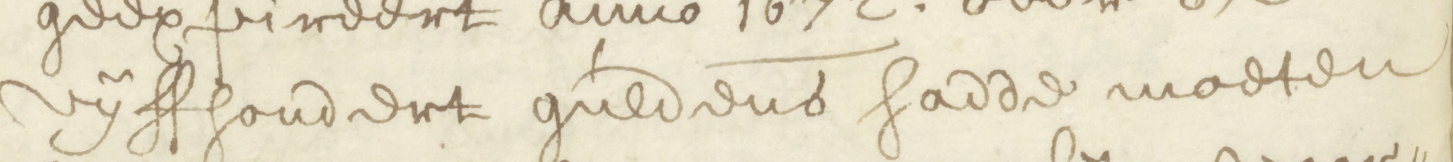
vijffhondert guldens hadde moeten
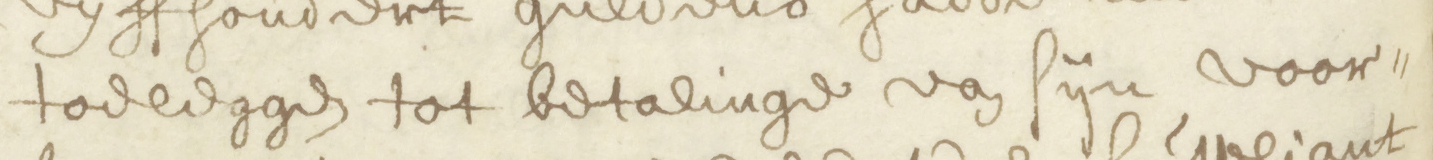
toeleggen tot betalinge van sijn voor„
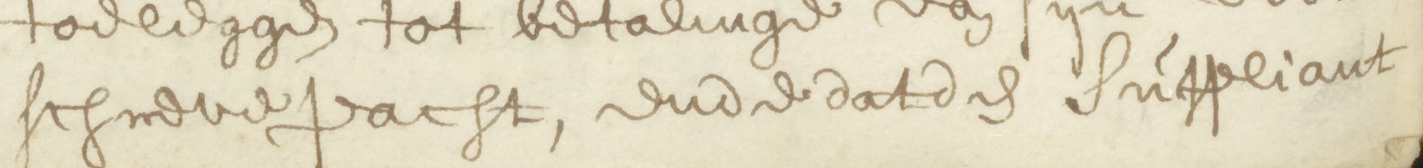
schreve pacht, ende dat den Suppliant
